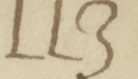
113
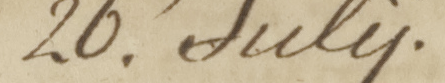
26. Julij.
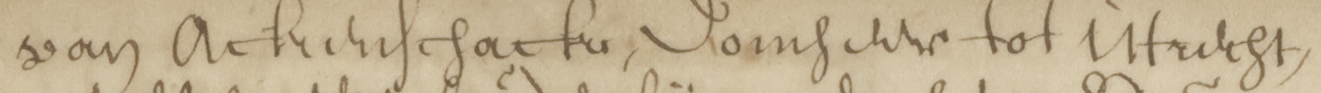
van Ackenschack, Domheer tot Utrecht,
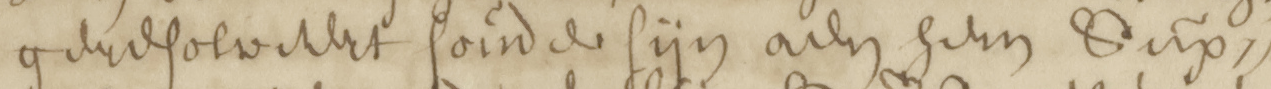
geresolveert soude sijn aen den Sup„
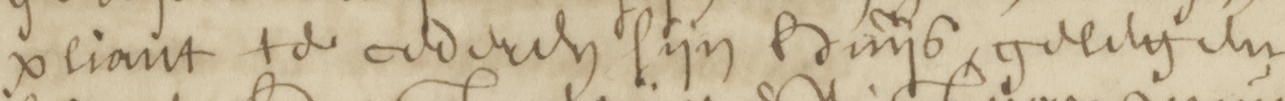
pliant te cederen sijn Huijs, gelegen
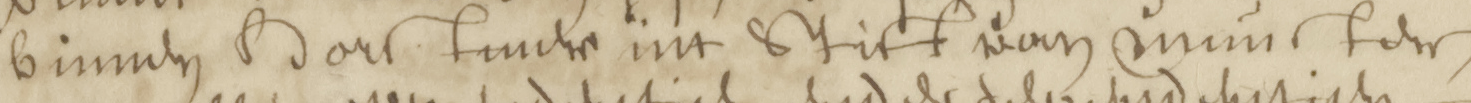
binnen Horstmer int Stift van Munster,
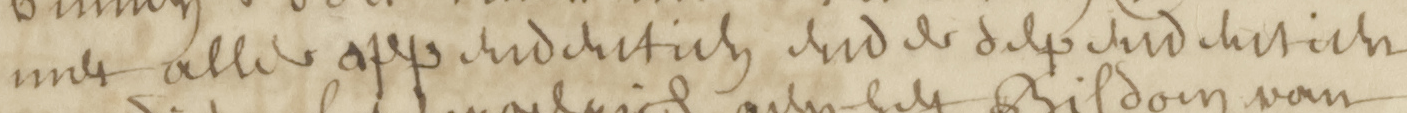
met alle appendentien ende dependentien
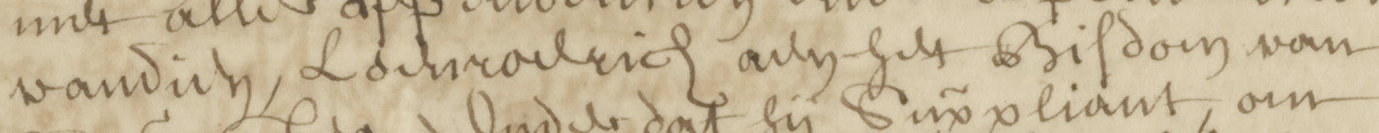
vandien, Leenroerich aen het Bisdom van
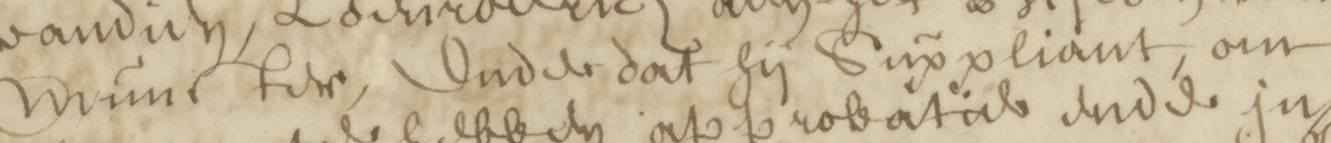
Munster, Ende dat hij Suppliant, om
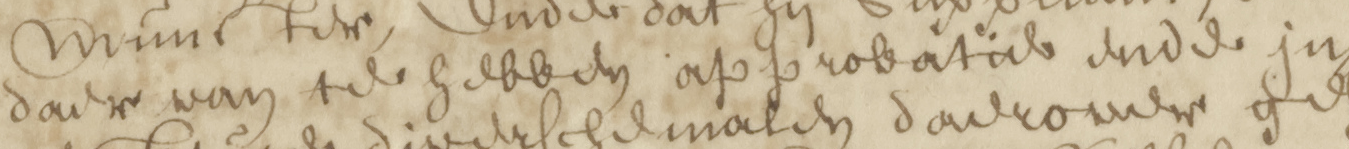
daer van te hebben approbatie ende in„
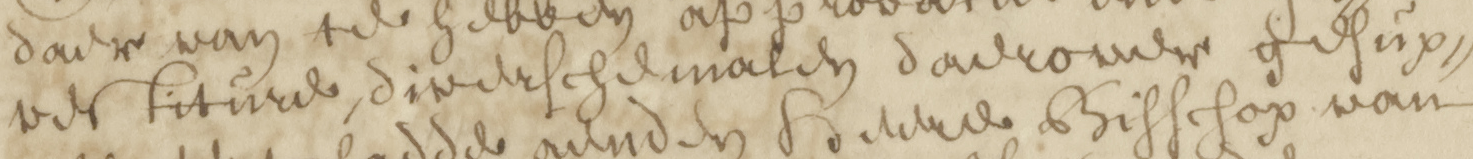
vestiture, diversche malen daerover gesup„
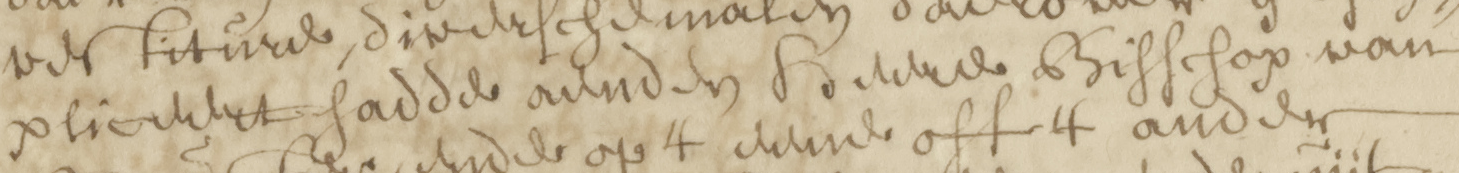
pliceert hadde aenden Heere Bisschop van
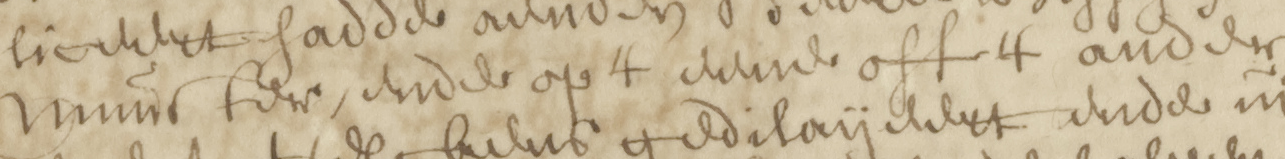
Munster, ende op‛t eene off ‛t ander
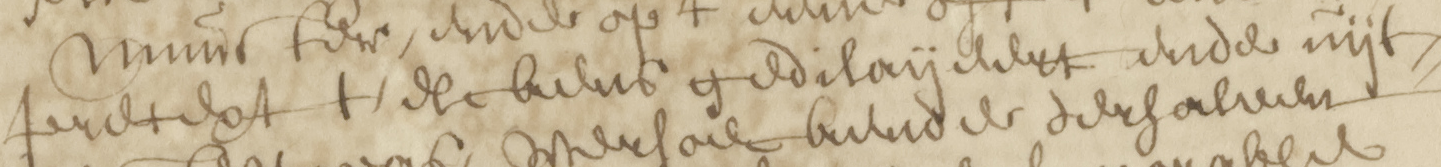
pretext t‛elckens gedilaijeert ende uijt„
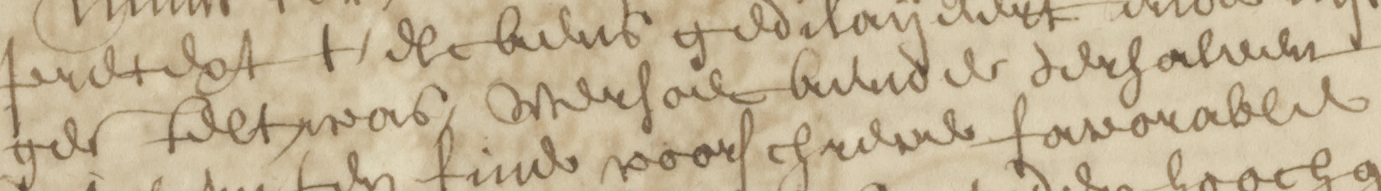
gestelt was, versoeckende derhalven
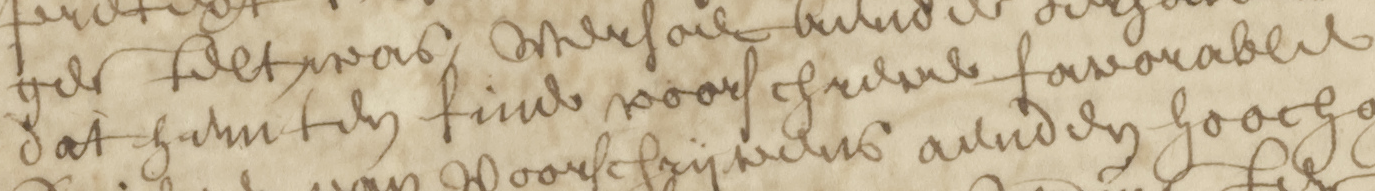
dat hem ten fine voorschreve favorable
